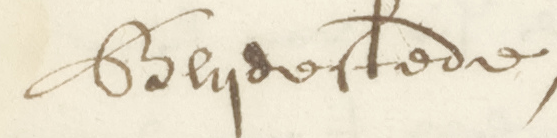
Blijdestede
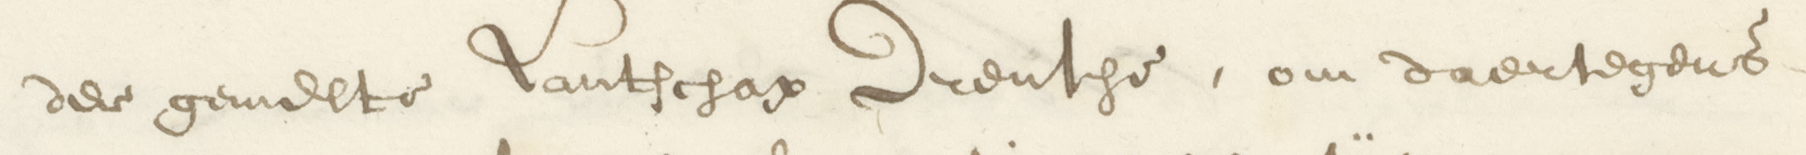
der gemelte Lantschap Drenthe, om daertegens
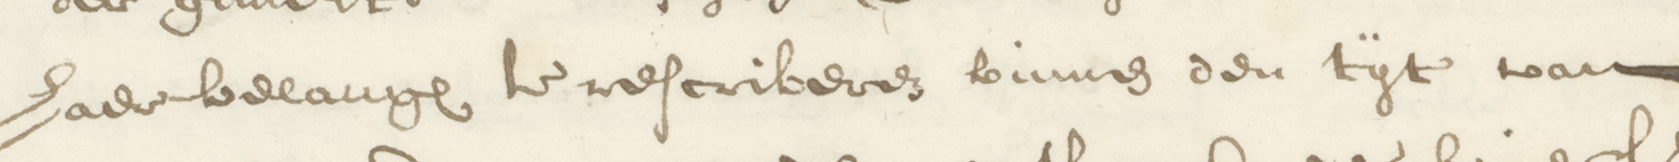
haer belangh te rescriberen binnen den tijt van
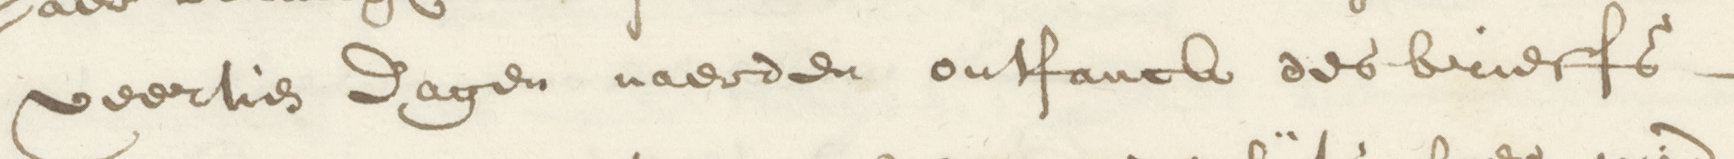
veertien Dagen naerden ontfanck des brieffs —,
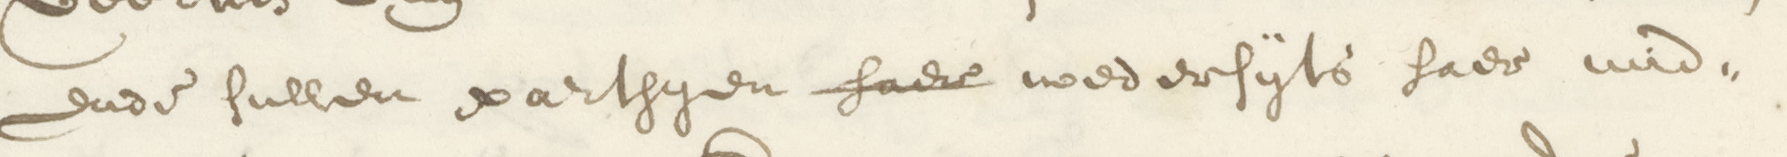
ende sullen parthyen haer wedersijts haer mid„
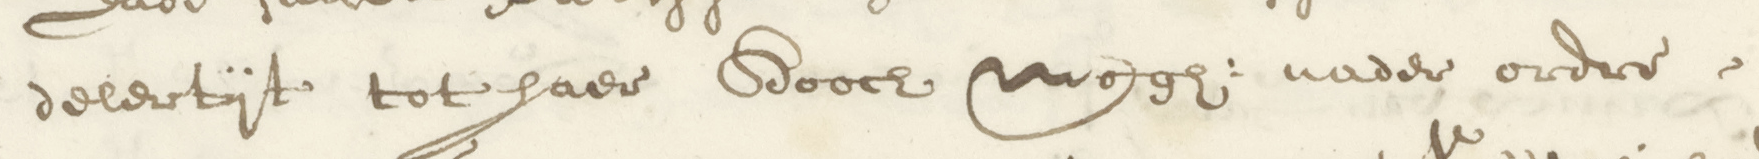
delertijt tot haer Hooch Mogh: nader ordre
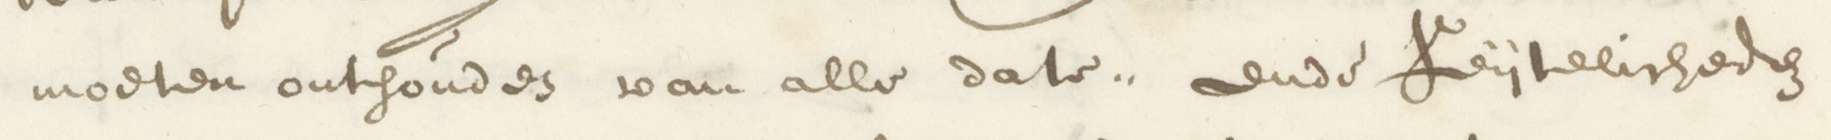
moeten onthouden van alle date, ende Feijtelicheden
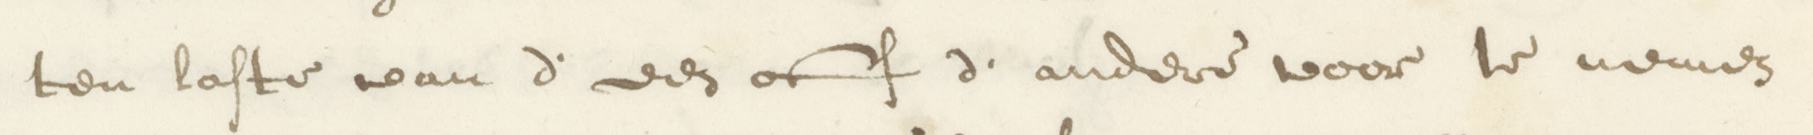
ten laste van d‛een off d‛andere voor te nemen,
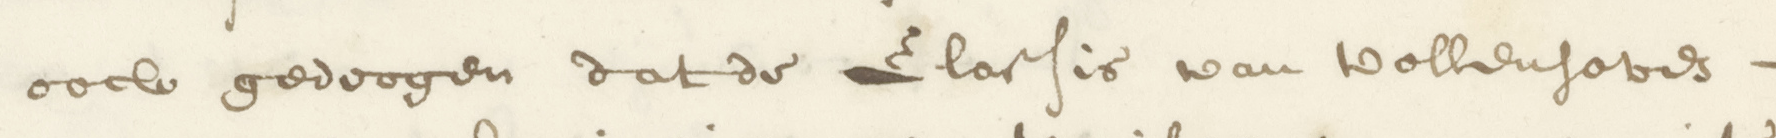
oock gedoogen dat de Classis van vollenhoven
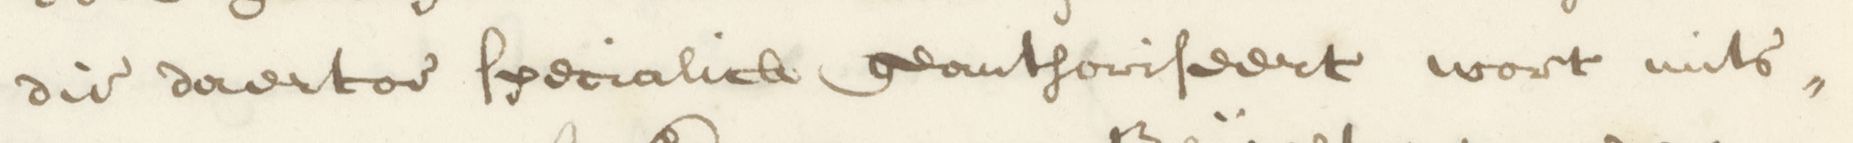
die daertoe specialick geauthoriseert wort mits„
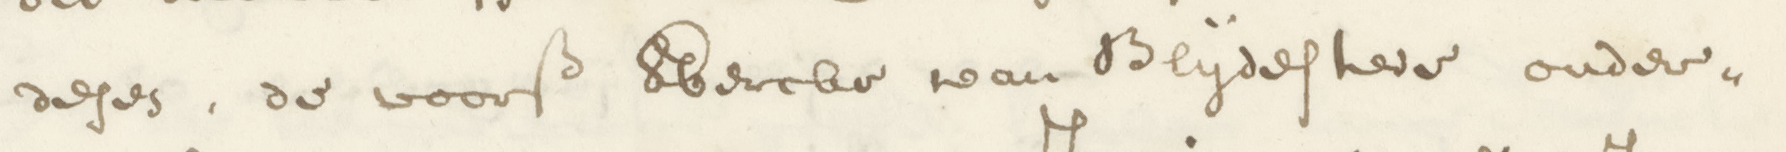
deses, de voors Wercke van Blijdestede onder„
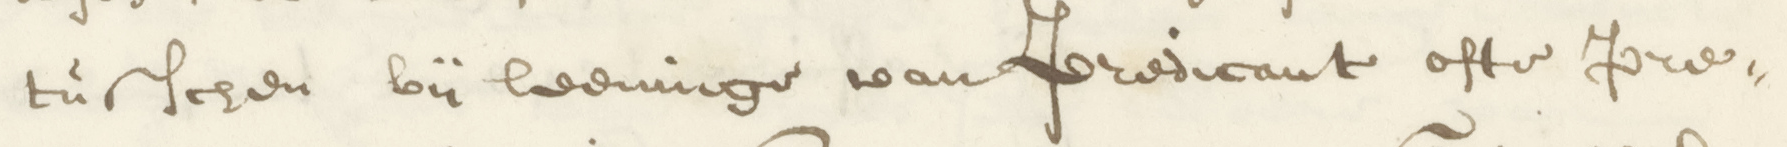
tusschen bij leeninge van Predicant ofte Pre„
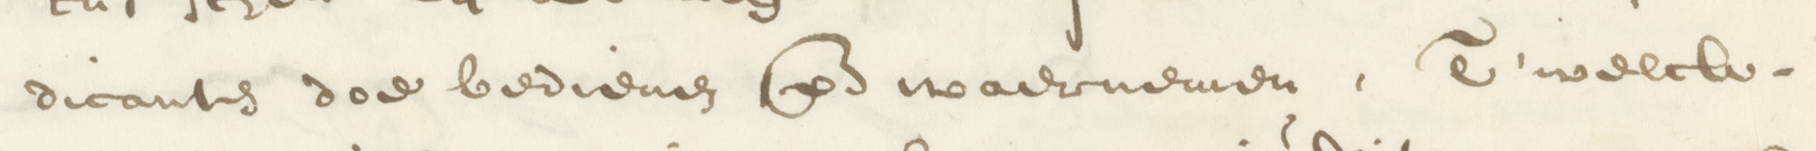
dicanten doe bedienen & waernemen, T‛welck
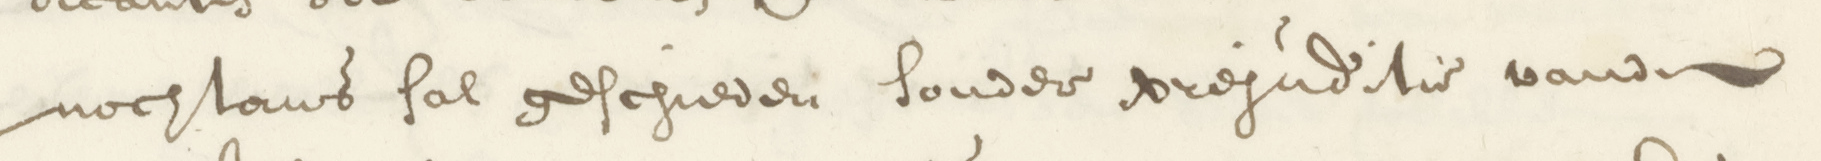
nochtans sal geschieden sonder prejuditie vande
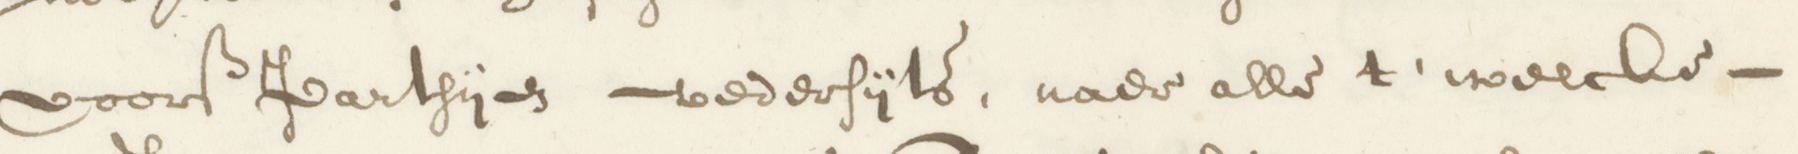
voors Parthijen, wedersijts, naer alle t' welcke—
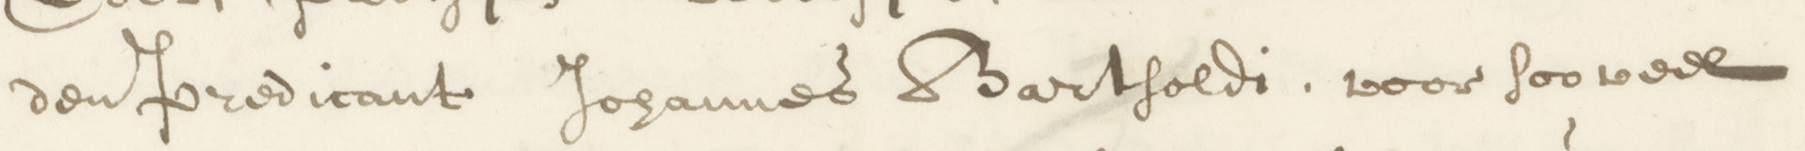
den Predicant Johannes Bartholdi, voor soo veel
